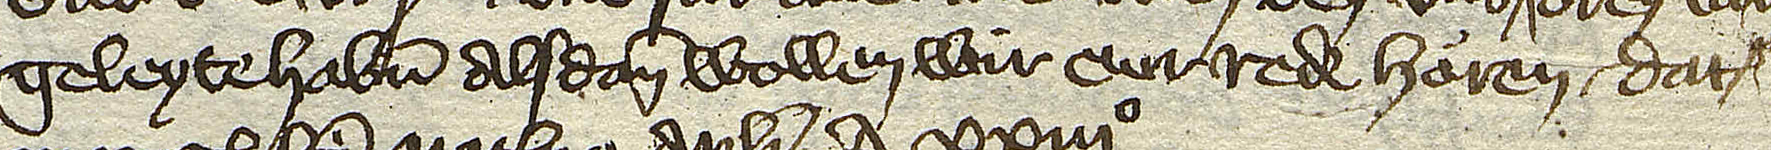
geleyte hab*n Alſdan* wollen wir ewr rede hören / Dat*
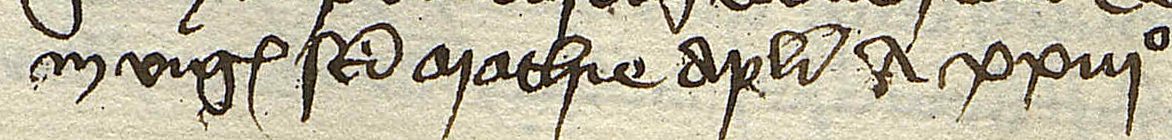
in vig* ſci* Mathie Apli* A xxiii*
